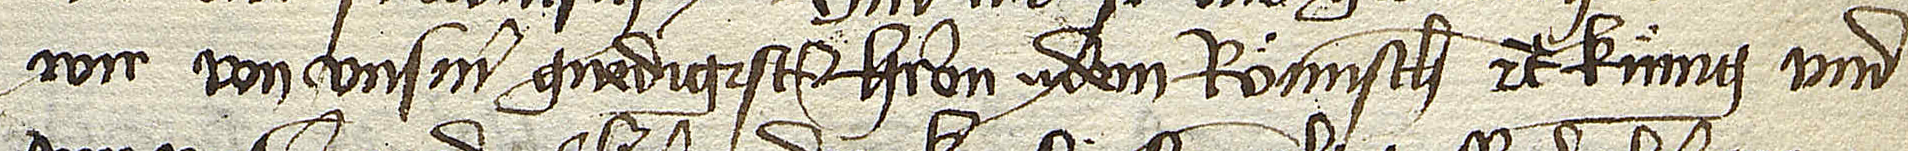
wir von vnſ*m gnedigiſt* hr*en ~ dem Römiſch* ec* künig vnd
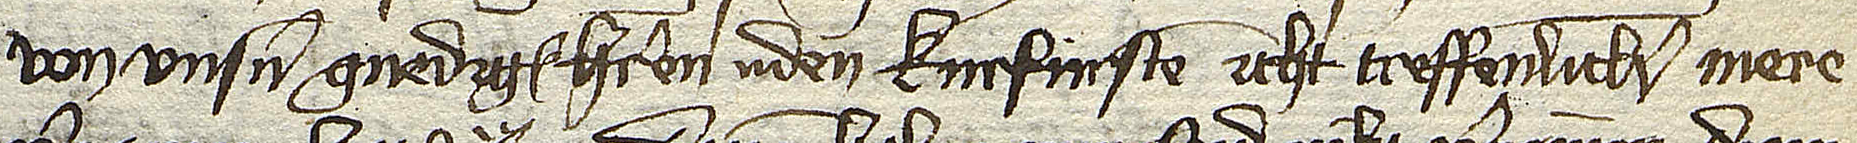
von vnſ*n gnedig* hr*en ~ den kurfürſte* icht treffenlich* mere
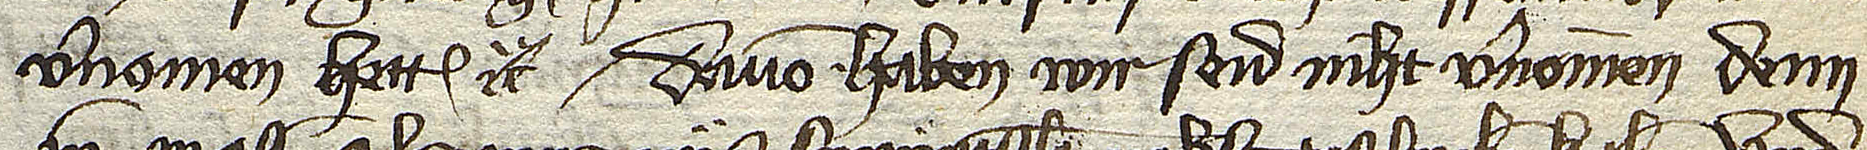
v*nomen hett* ec* / Dauo* haben wir ſend niht v*nomen denn
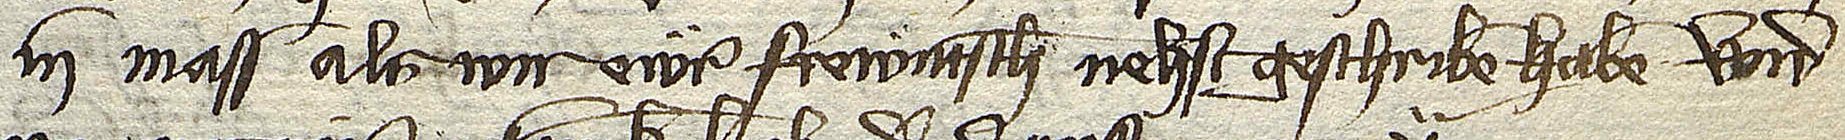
in maſſ* als wir eẅr* freẅntſch* nehſt geſchribe* habe* . Vnd
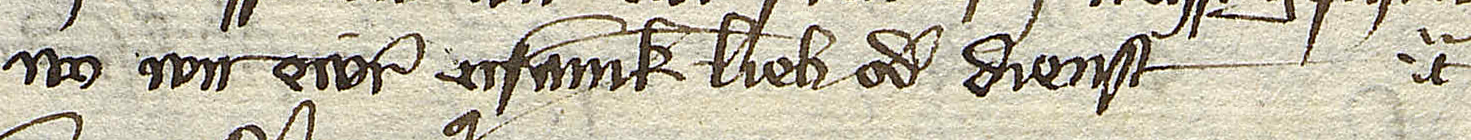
wo wir eẅr* erſamk* lieb od* dienſt ec*
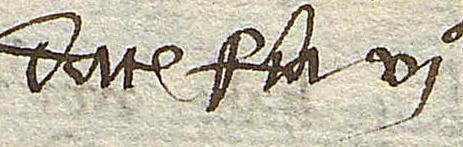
Dat* fia* vi*
